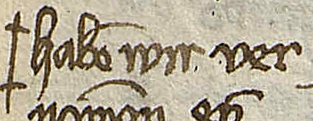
habe* wir ver
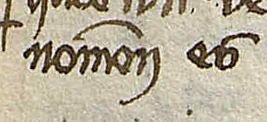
nomen* es
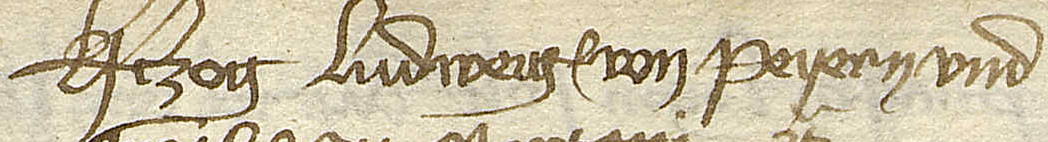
H*cʒog Ludweig* von Peyern vnd
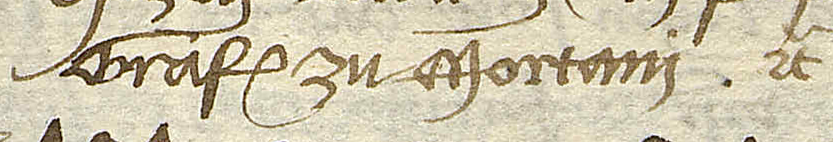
Graf* ʒu Mortani . ec*
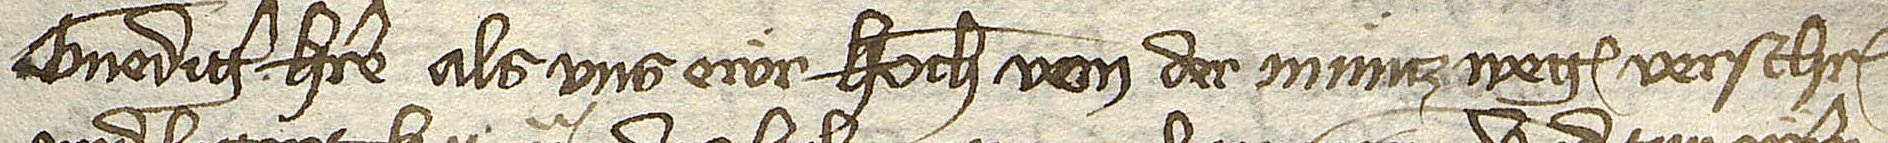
Gnedig* hre* als vns ewr hoch* von der müncʒ weg* verſchr*
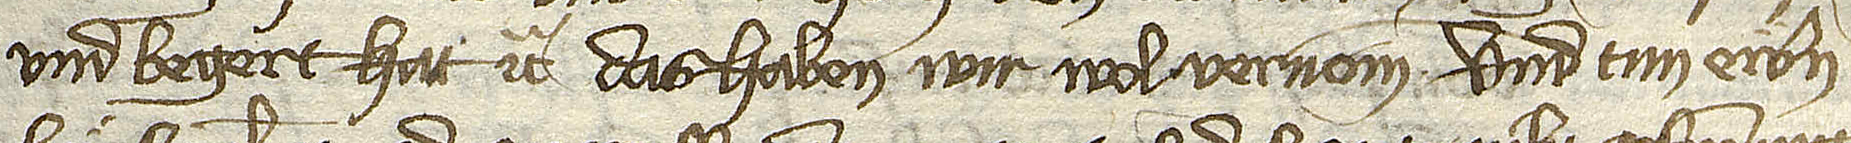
vnd begert hat ec* das haben wir wol vernom* . Vnd tun ew*n
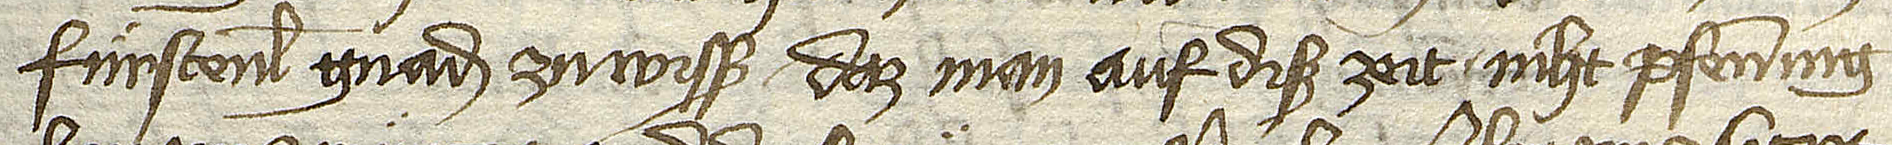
fürſtenl* gnad* ʒu wiſſ* / daʒ man auf diſʒ ʒeit niht pfennig*
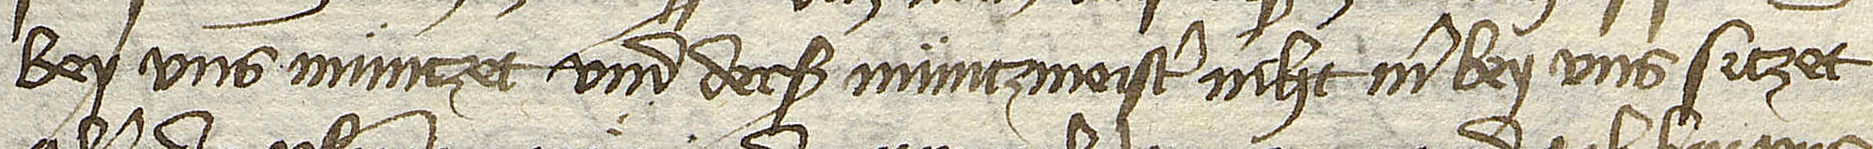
bey vns müncʒet vnd derſ* müncʒmeiſt* niht m* bey vns ſicʒet
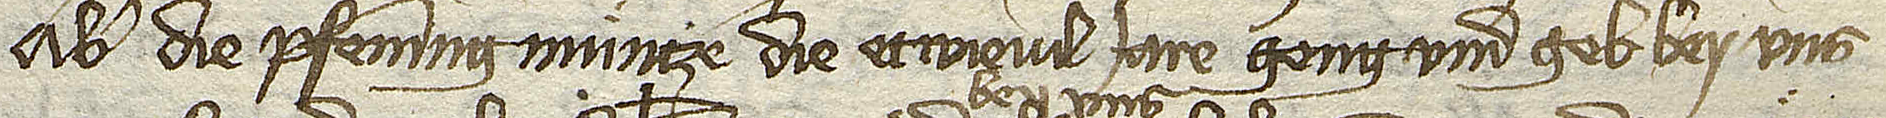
ab* die pfennig* müncʒe die etwieuil Iare geng vnd geb bey vns
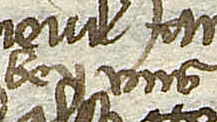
bey vns
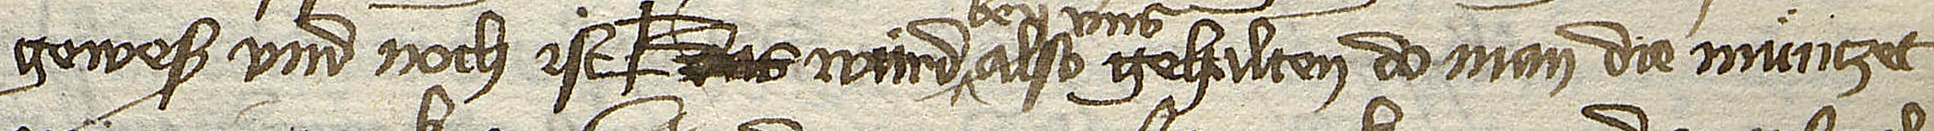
geweſ* vnd noch iſt das wurd alſo gehalten do man die müncʒet
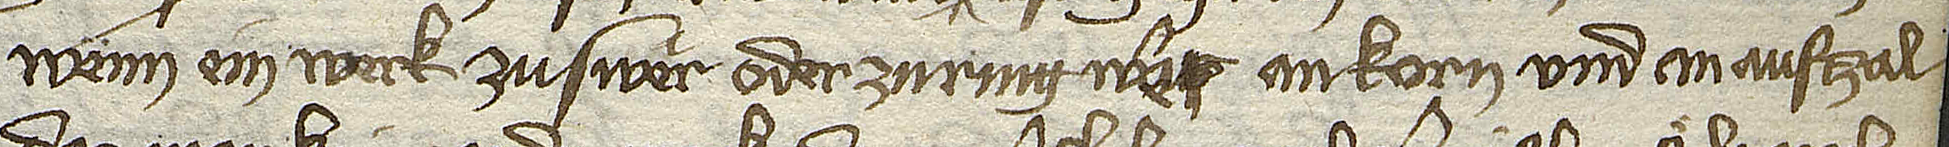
wënn ein werk ʒuſwër oderr ʒuring wa*s an korn vnd an aufcʒal
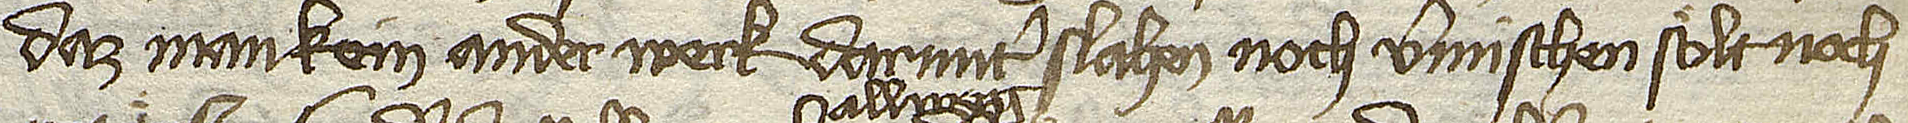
daʒ man kein ander werk darunt* ſlahen noch v*miſchen ſölt noch
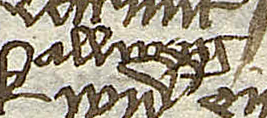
allweg
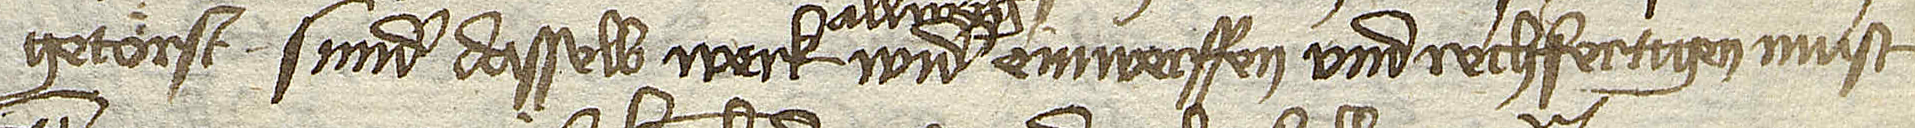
getörſt ſund* daſſelb werk wid* einwerffen vnd rechfertigen muſt
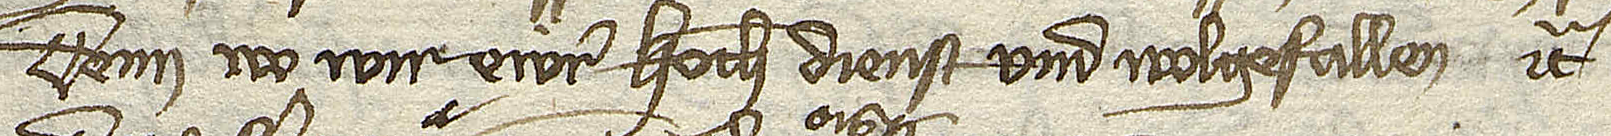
Denn wo wir ewr* hoch* dienſt vnd wolgefallen ec*
